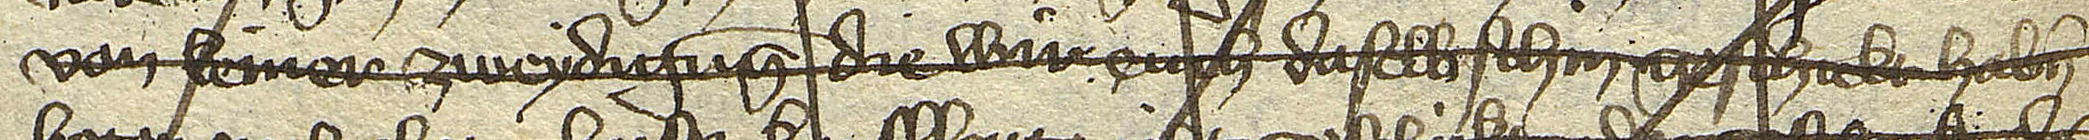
von keiner cʒweydigug* die wir euch daſelbſthin geſchickt habn*
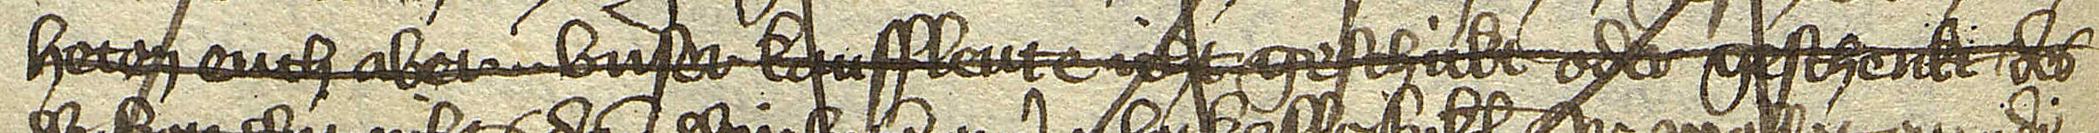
heten euch aber ~ vnſer kauffleute icht geſchickt oder geſchenkt des
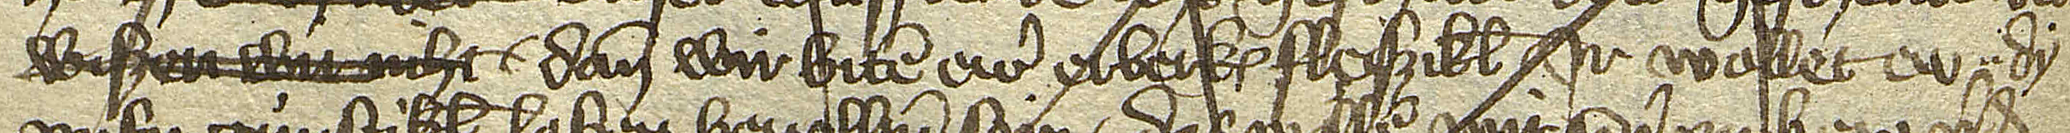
wiſʒen wir niht / dan* wir bite* ew* erberk* fleiſʒikl* Ir wöllet ew ~ dy
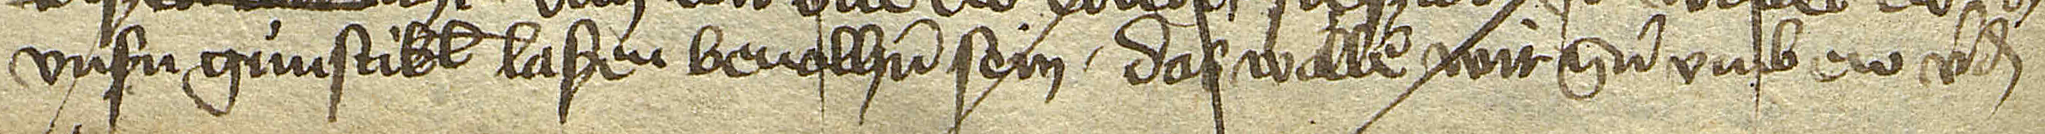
vnſ*n günſtikl* laſʒen beuolhn* ſein / das wölle* wir gn* vmb ew v*d*
